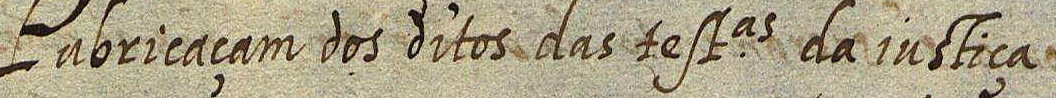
Pubricaçam dos ditos das test.as da iustiça
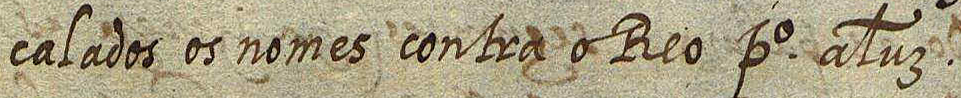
calados os nomes contra o Reo po. al̄uz.
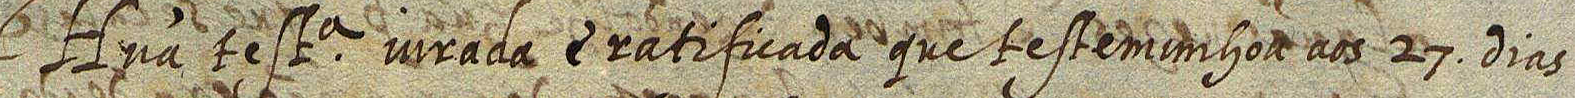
Huā testa. iurada e ratificada que testemunhou aos 27. dias
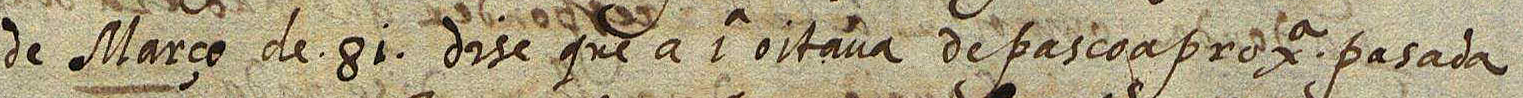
de Março de 8i dise que a 1a oitaua de pascoa proxa. pasada
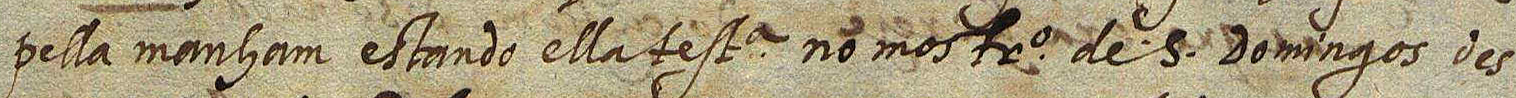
pella manham estando ella testa. no mostro. de .S. Domingos des
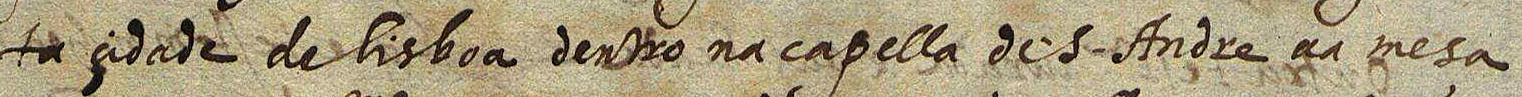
ta çidade de lisboa dentro na capella de .S. Andre aa mesa
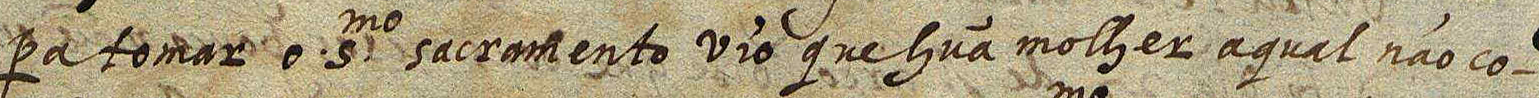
ꝑa tomar o .s.mo sacramento vio que huā molher a qual não co
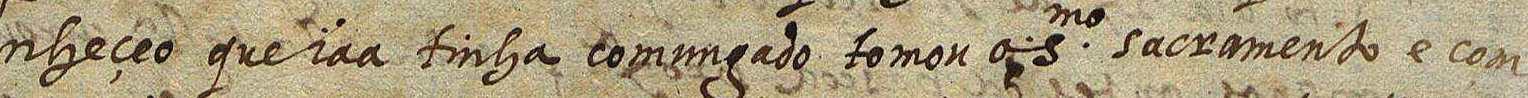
nheçeo que iaa tinha comungado tomou o .smo. sacramento e com
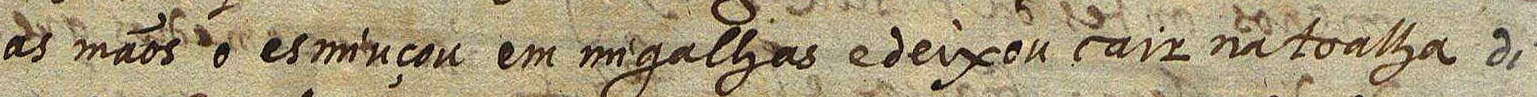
as maõs o esmiuçou em migalhas e deixou cair na toalha di
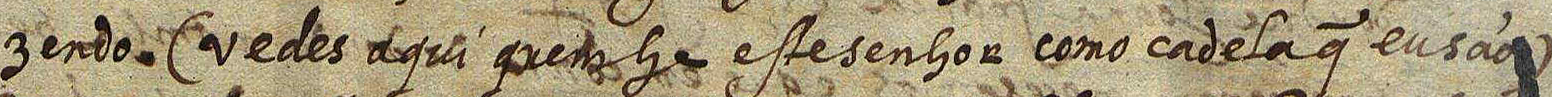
zendo (vedes aqui quem he este senhor como cadela q̄ eu saõ)
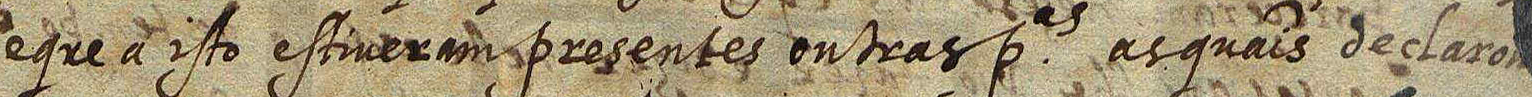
e que a isto estiueram presentes outras pas. as quaīs declarou
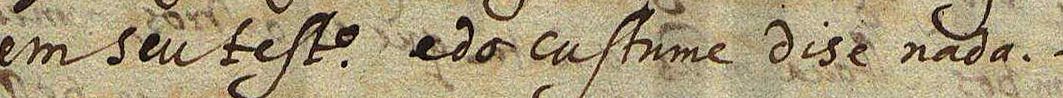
em seu testo. e do custume dise nada.
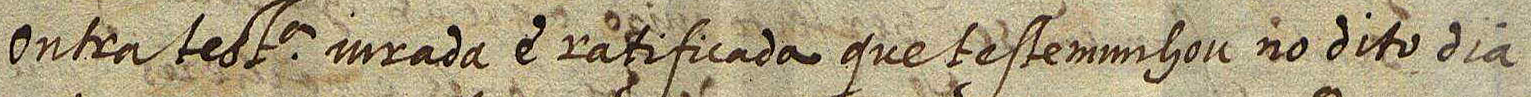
outra test.a iurada e ratificada que testemunhou no dito dia
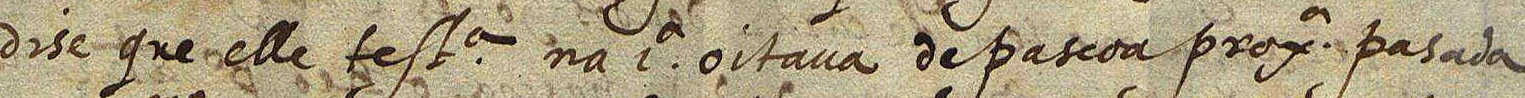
dise que elle testa. na 1a. oitaua de pascoa prox.a pasada
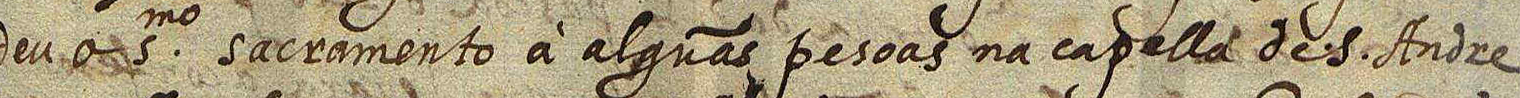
deu o smo. sacramento à alguās pesoas na capella de .S. Andre
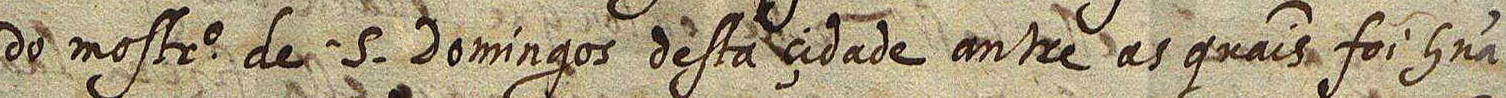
do mostr.o de .S. Domingos desta çidade antre as quaīs foi huā
